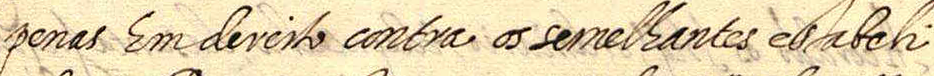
penas Em dereito contra os semelhantes estabeli
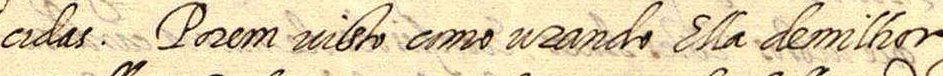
cidas. Porem uisto como uzando Ella de milhor
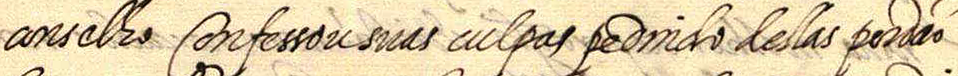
conselho Confessou suas culpas pedindo dellas perdaõ
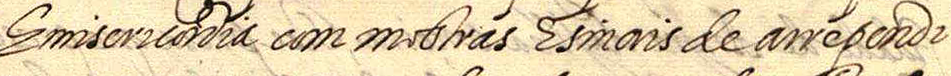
E misericordia com mostras E sinais de arrependi
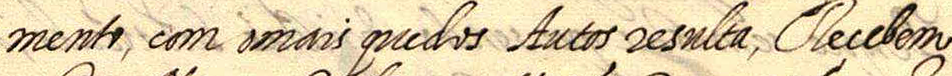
mento, com o mais que dos Autos resulta, Recebem
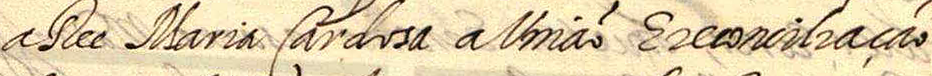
a Ree Maria Cardosa a Uniaõ E reconciliaçaõ
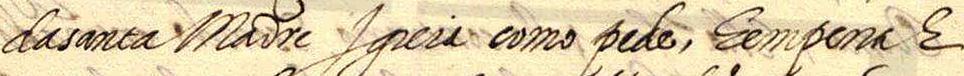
da santa Madre Jgreia como pede, E em pena E
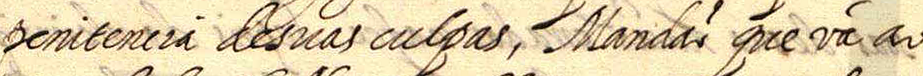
penitencia de suas culpas, Mandaõ que vá ao
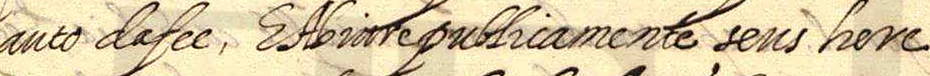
auto da fee, E Abiure publicamente seus here
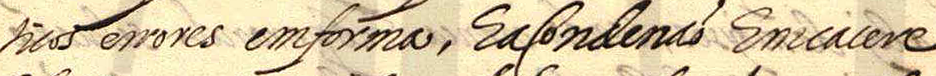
ticos errores em forma, E a Condenaõ Em cacere
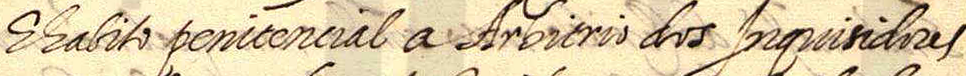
E habito penitencial a Arbitrio dos Jnquisidores
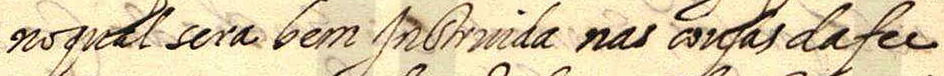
no qual sera bem Jnstruida nas cousas da fee
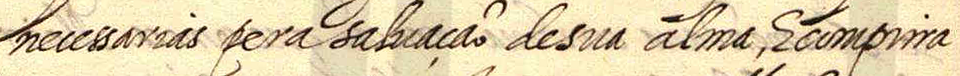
necessarias pera saluaçaõ de sua alma, E comprira
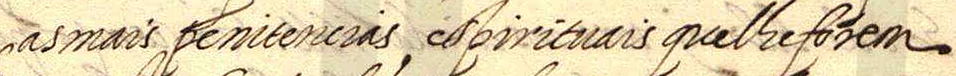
as mais penitencias espirituais que lhe forem
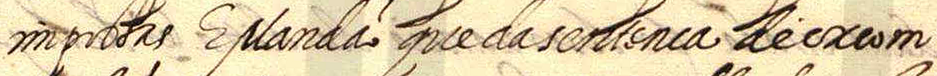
impostas E Mandaõ que da sentenca de excom
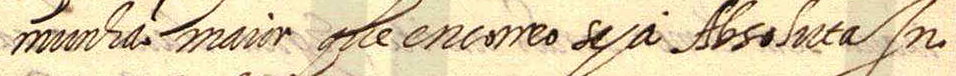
munhaõ maior que encorreo seja Absoluta Jn
